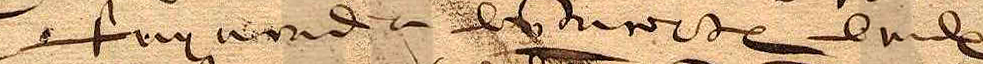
fuy a cadea desta corte domde
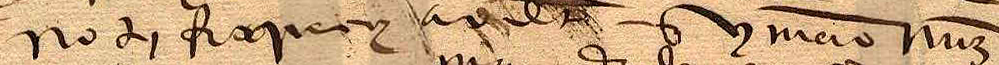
notyfiquey ao dtō symão nūz
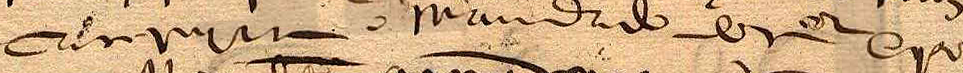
cacereyro o mandado do cor e por
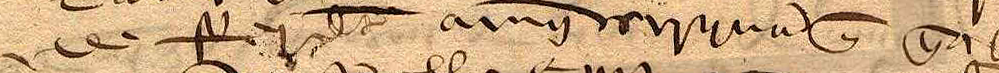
elle foy dtō a mȳ escryuuaõ q̄ gas
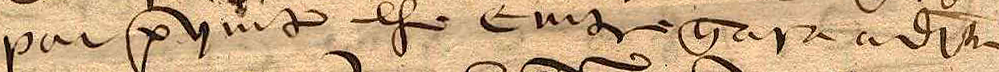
par pymto lhe Emtregara a djta
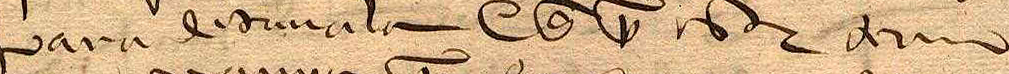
Joana de tauara e q̄ p̄o este termo
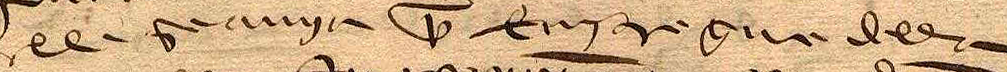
elle se avya p̄o Emtregue della
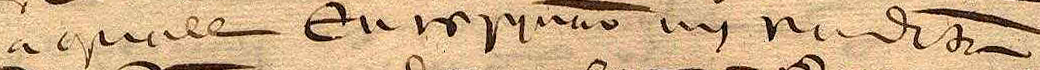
a quall Eu escryuão uy na dita
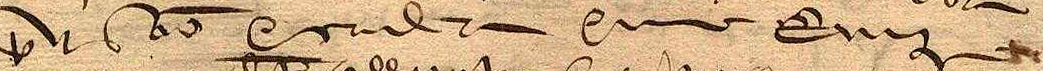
p̄ysão e cadea e me Entre
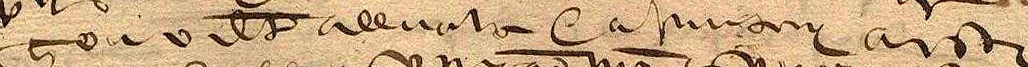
gou o dito alluara e aJuntey a este
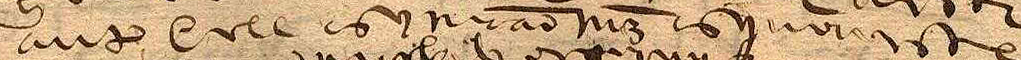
auto e ell symão nūz asynou este
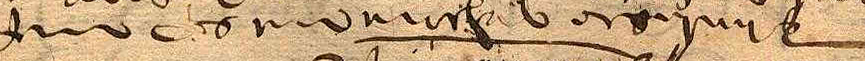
termo cosmo machado o escreuy
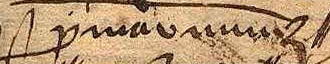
symão nunez
